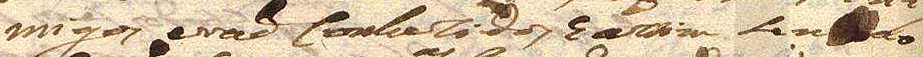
migos eraõ Conhecidos E assim sen_do
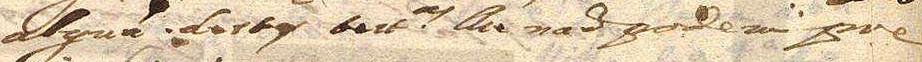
alguā destas testas lhe naõ podem pre
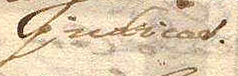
judicar.
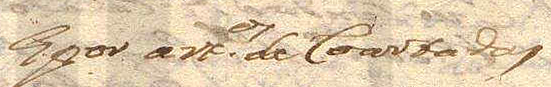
E por art.os de Coartadas
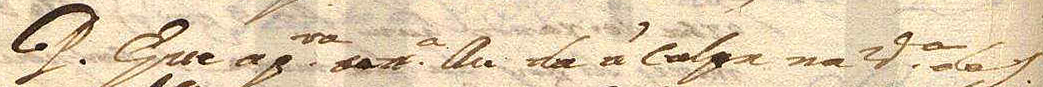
P. Que a p.ra test.a Ree da á culpa na V.a de s.
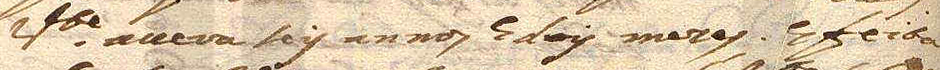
V.te auera seis annos E dois mezes. E feita
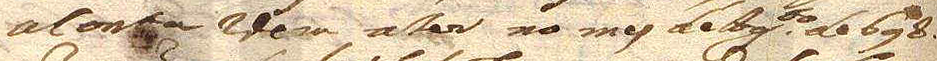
a Conta Vem a ter no mes de Ag.o de 698.
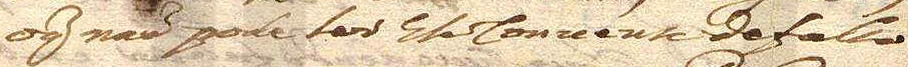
o q̄ naõ pode ser E se Conuense de falso
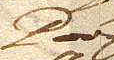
Porq̄
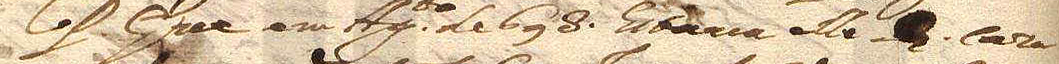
P. Que em Ag.o de 698. Estaua elle R. caza
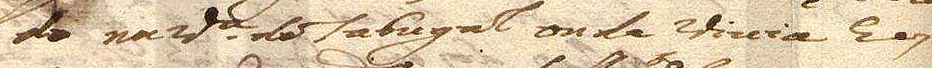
do na V.a do sabugal onde viuia E es
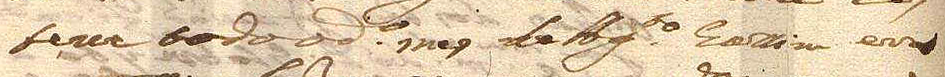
teue todo o d.o mes de Ag.do E assim era
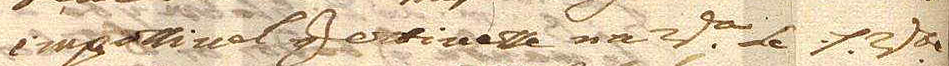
impossiuel q̄ estiuese na V.a de s. V.te
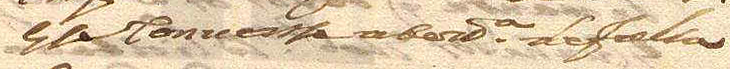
Ele Conuense a test.a de falsa
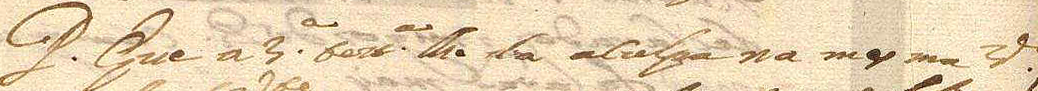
P Que a 3.a test.a lhe da a culpa na mesma V.a,
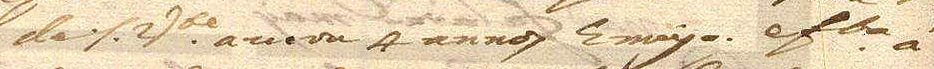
de S. V.te auera 4 annos E meyo. e ft.a a
